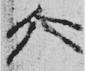六
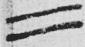二
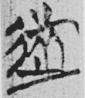○（旅）
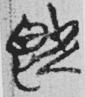既
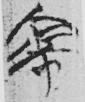○（釐）
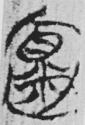○（懷）
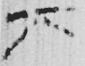亓（其）
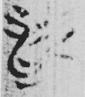○（資）
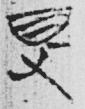○（得）
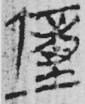僮（童）
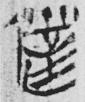○（僕）
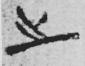之
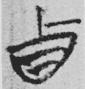貞
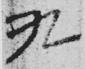九
